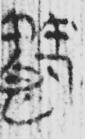節
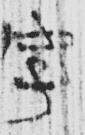好
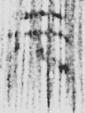亓（其）
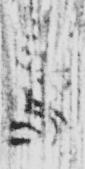頌（容）
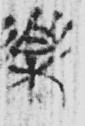樂
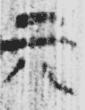亓（其）
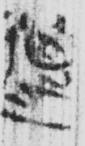道
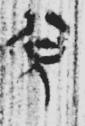兌（悅）
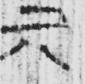亓（其）
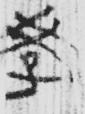○（教）
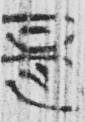是
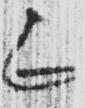㠯（以）
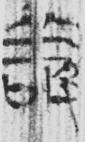敬
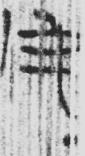𡚦（焉）
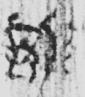拜
